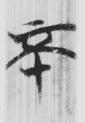不
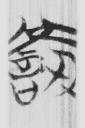罰
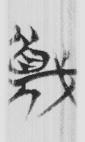蔑
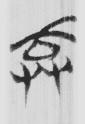弃
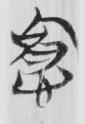{肙心}
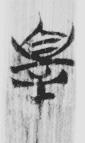辠
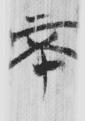不
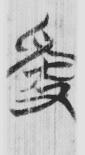爯
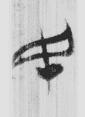民
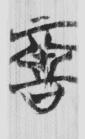{亞口}
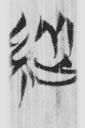緃
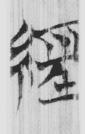經
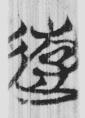遊
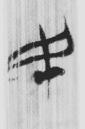民
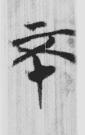不
